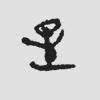星
